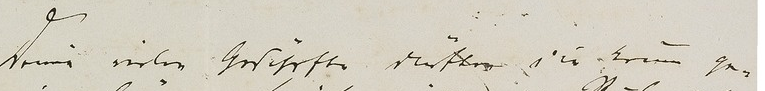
Deine vielen Geschäfte dürften dir kaum ge-
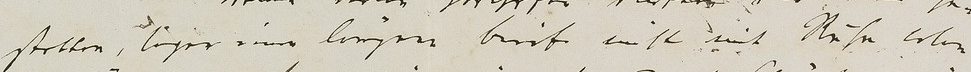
statten, sogar einen längern Brief nicht mit Ruhe lesen
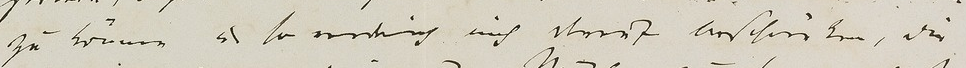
zu können u. so werde ich mich darauf beschränken, dir
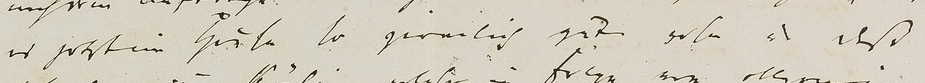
es jetzt im Hause so ziemlich gut gehe u. daß
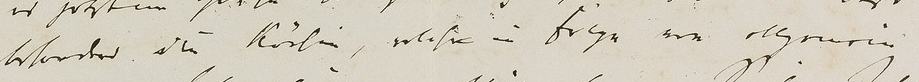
besonders die Köchin, welche in Folge von allgemein
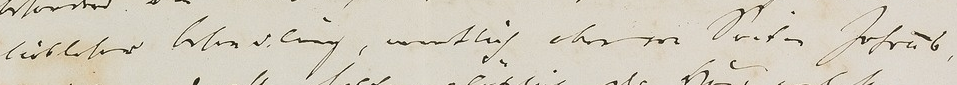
liebloser Behandlung, namentlich aber von Seiten Johanns,
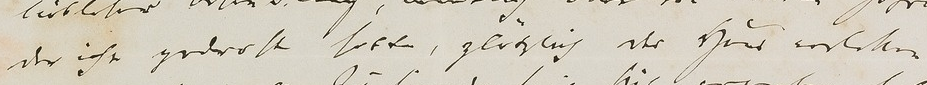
der ihr gedroht hatte, plötzlich das Haus verlassen
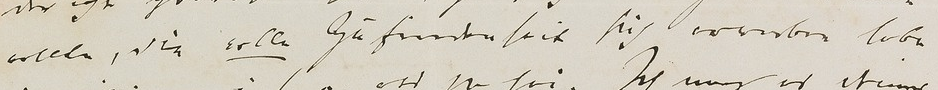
wollte, die volle Zufriedenheit sich erworben habe
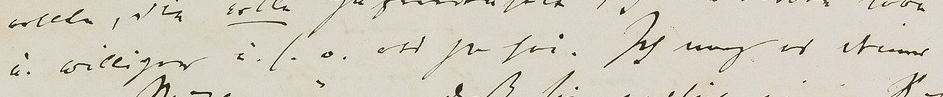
u. williger u. s. w. als je sei. Ich mag es deiner
